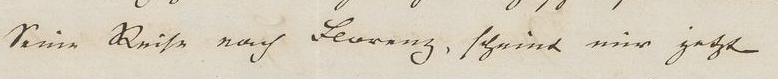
Seine Reise nach Florenz, scheint mir jetzt
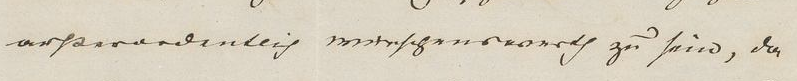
außerordentlich wünschenswerth zu sein, da
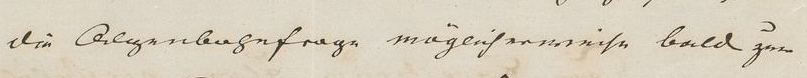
die Alpenbahnfrage möglicherweise bald zur
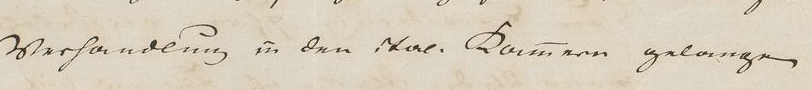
Verhandlung in den ital. Kammern gelangen
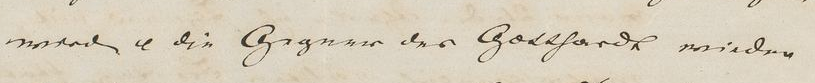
wird & die Gegner des Gotthardt wieder
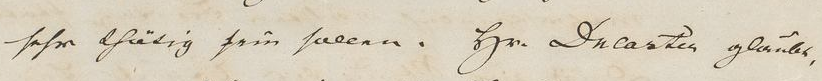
sehr thätig sein sollen. Hr. Ducoster glaubt,
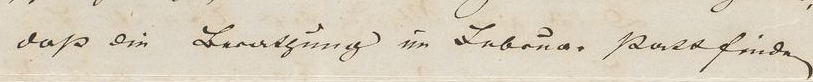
daß die Berathung im Februar stattfinden
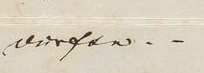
dürfte. –
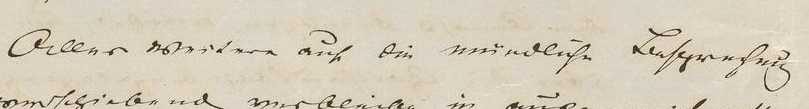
Alles Weitere auf die mündliche Besprechung
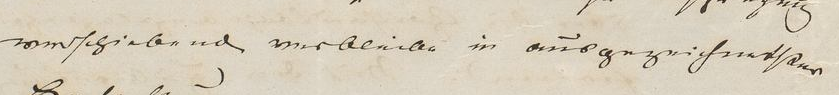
verschiebend verbleibe in ausgezeichnetster
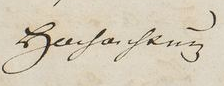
Hochachtung
